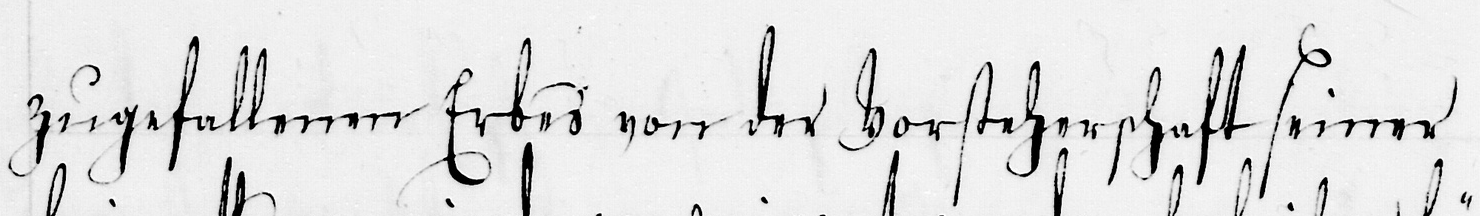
zugefallenen Erbes von der Vorsteherschaft seiner
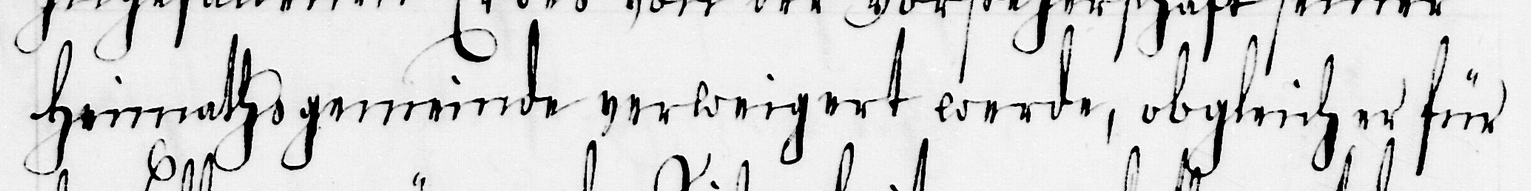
Heimathsgemeinde verweigert werde, obgleich er für
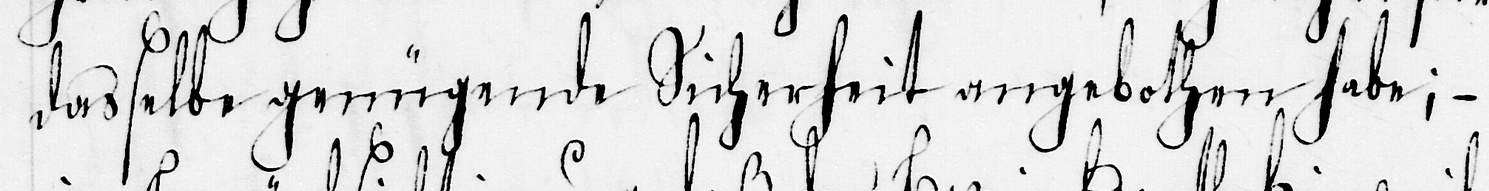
dasselbe genügende Sicherheit angebothen habe; –
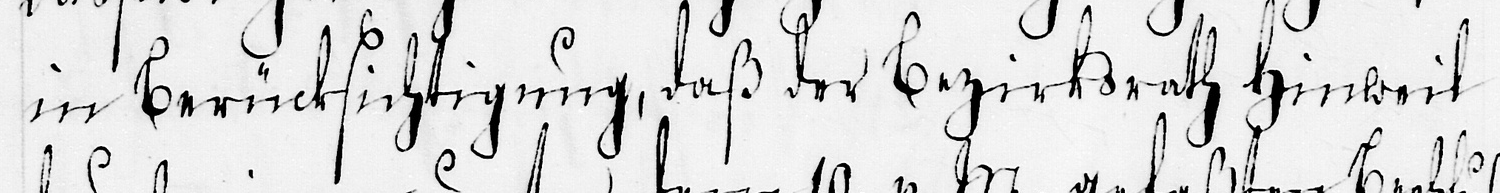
in Berücksichtigung, daß der Bezirksrath Hinweil
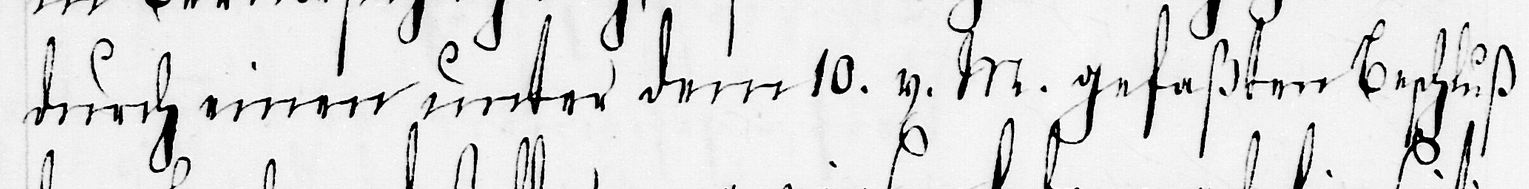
durch einen unter dem 10. v. M. gefaßten Beschluß
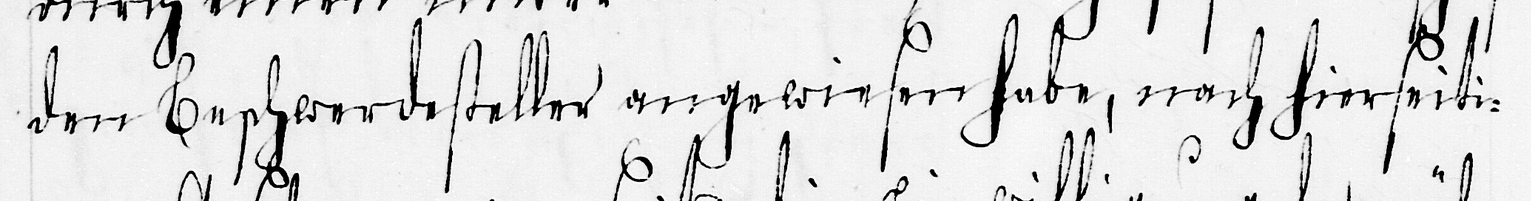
den Beschwerdesteller angewiesen habe, nach hierseiti¬
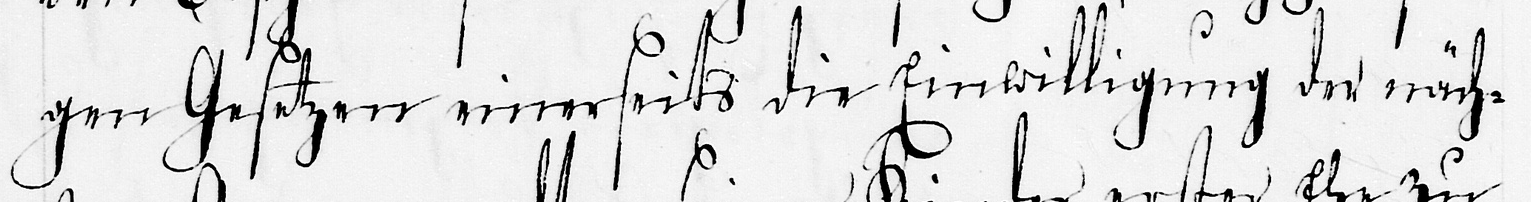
gen Gesetzen einerseits die Einwilligung der näch¬
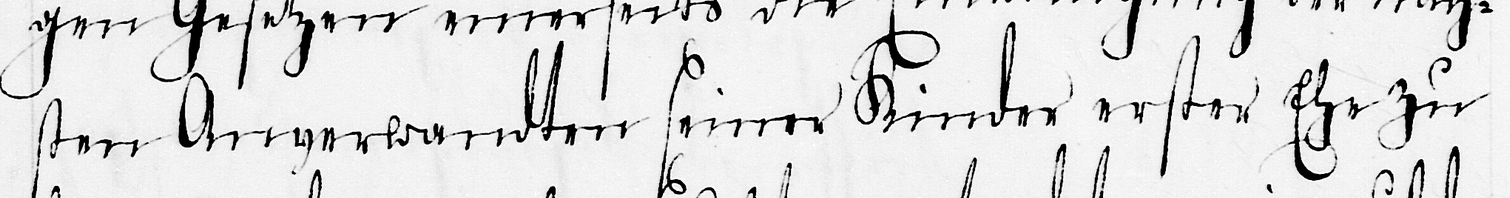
sten Anverwandten seiner Kinder erster Ehe zu
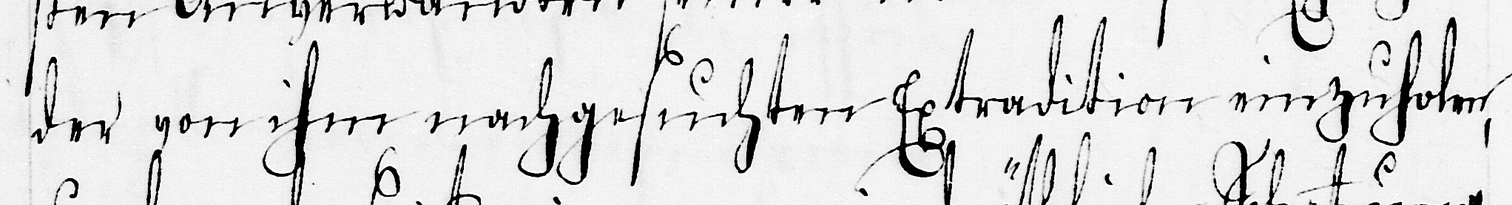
der von ihm nachgesuchten Extradition einzuhole¬
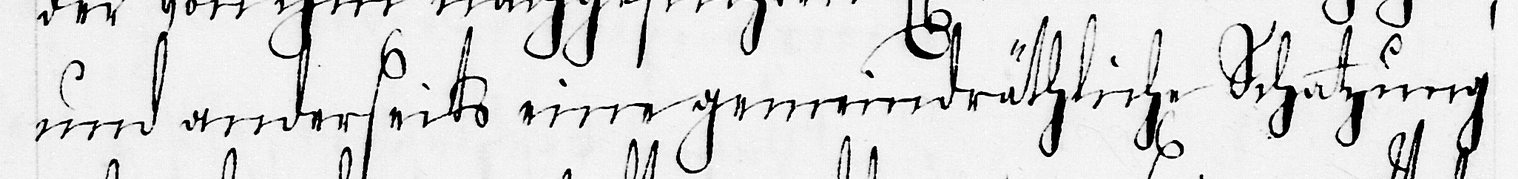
und anderseits eine gemeindräthliche Schatzung
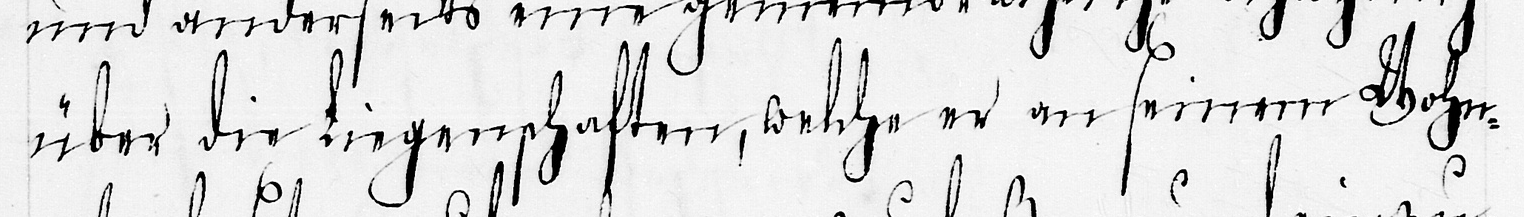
über die Liegenschaften, welche er an seinem Wohn¬
